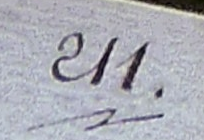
211.
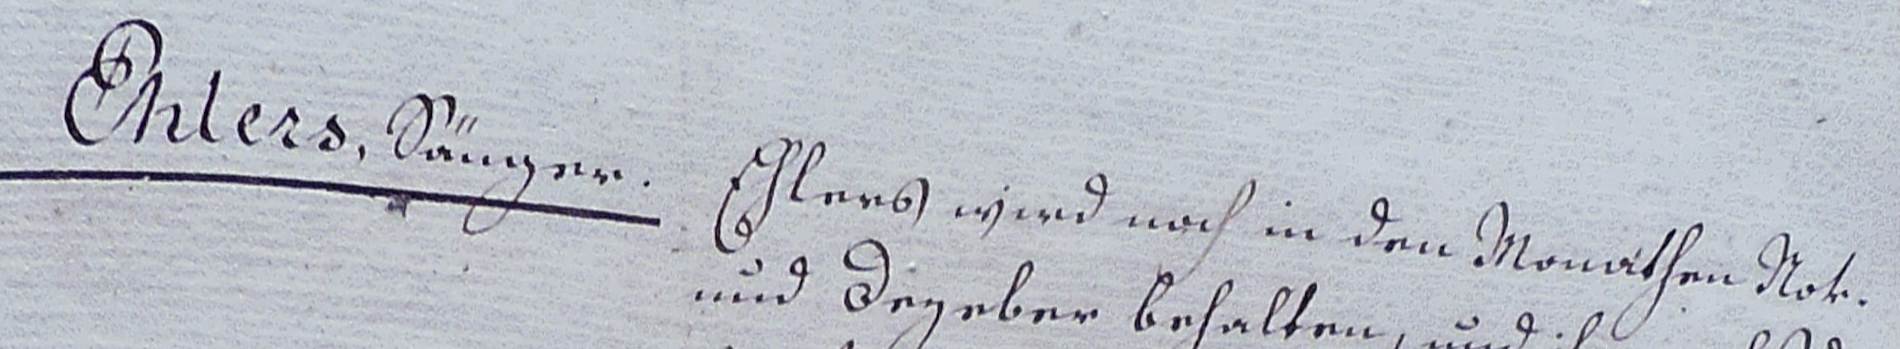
Ehlers, Sänger. Ehlers wird noch in den Monathen Nov.
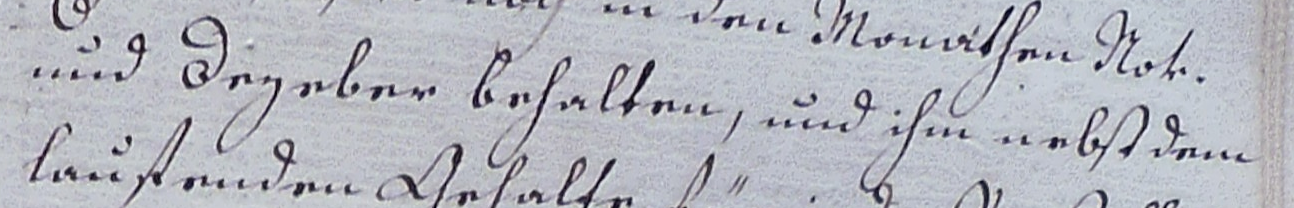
und Dezeber behalten, und ihm nebst dem
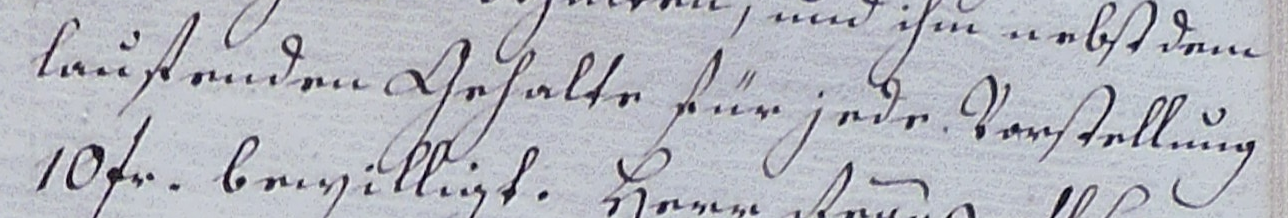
laufenden Gehalte für jede Vorstellung
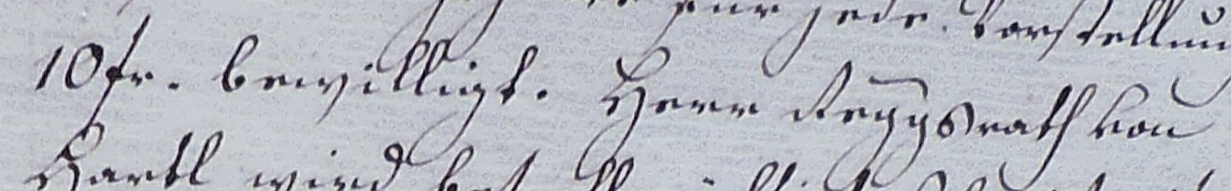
10fr. bewilligt. Herr Reg͞gsrath von
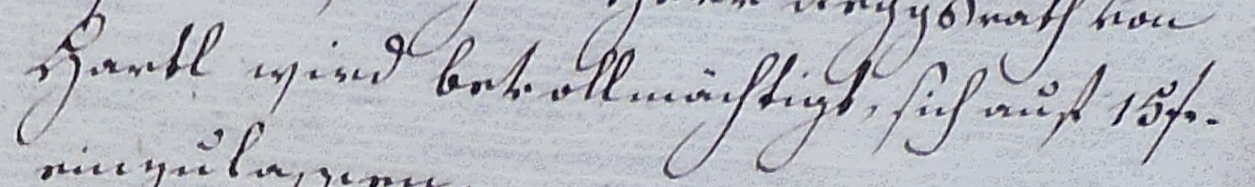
Hartl wird bevollmächtigt, sich auf 15fr.
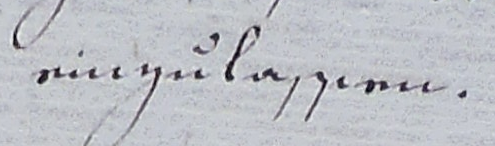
einzulassen.
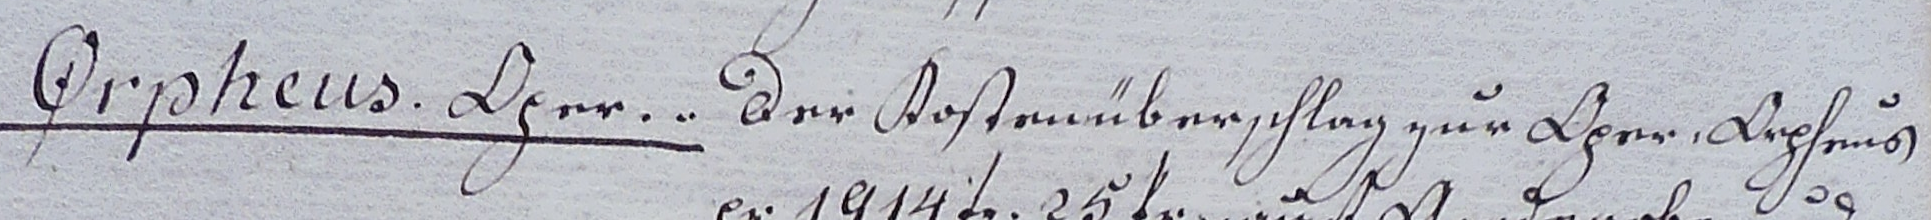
Orpheus. Oper. .. Der Kostenüberschlag zur Oper Orpheus
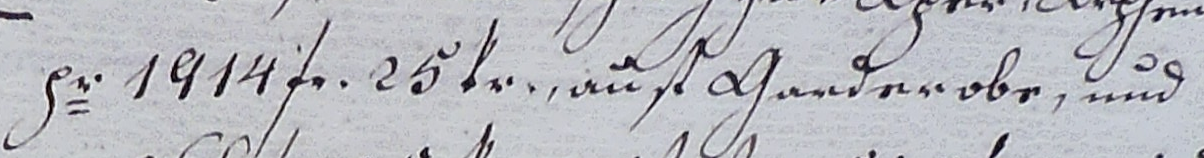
pr͇ 1914fr. 25kr., auf Garderobe, und
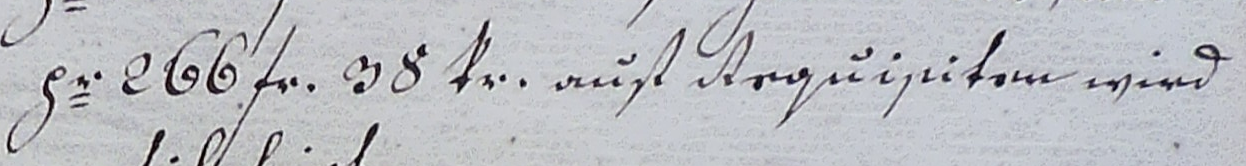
pr͇ 266fr. 38kr. auf Requisiten wird
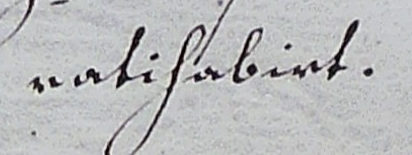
ratihabirt.
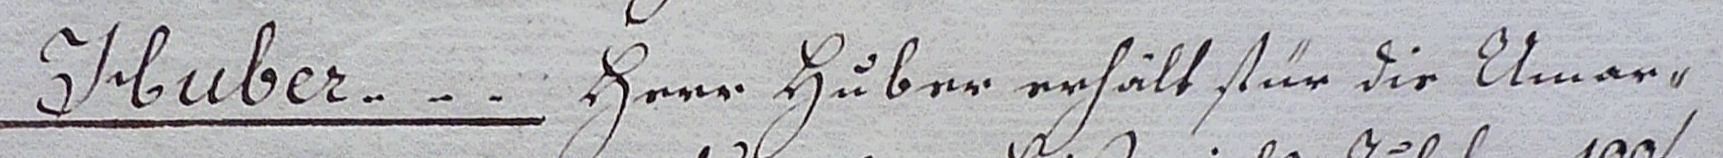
Huber .. .. . Herr Huber erhält für die Umar¬
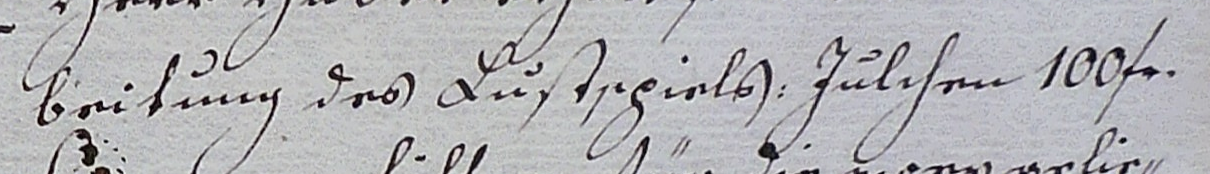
beitung des Lustspiels Julchen 100fr.
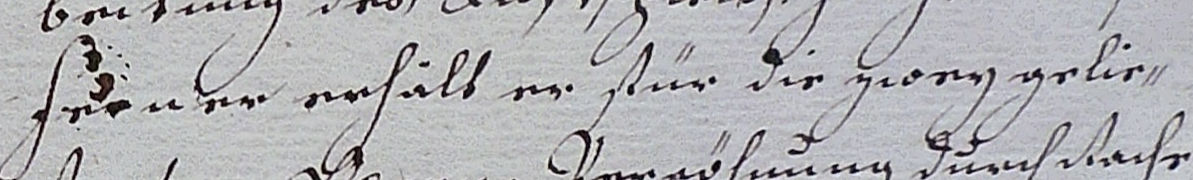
Ferner erhält er für die zwey gelie¬
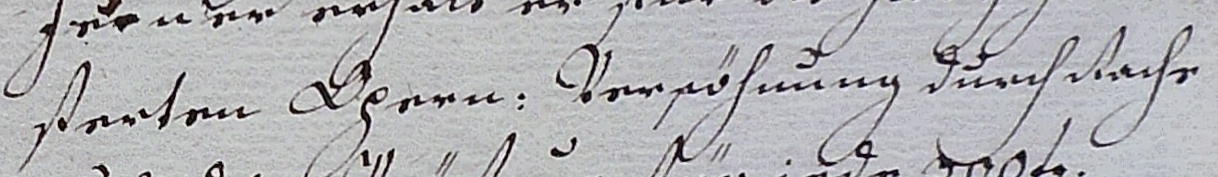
ferten Opern: Versöhnung durch Rache
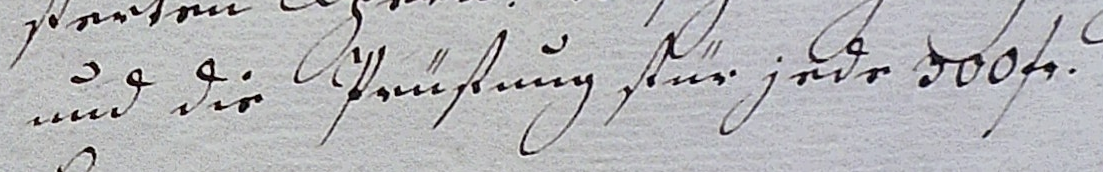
und die Prüfung für jede 300fr.
